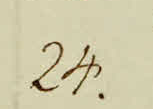24.
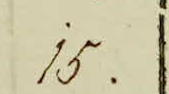15.
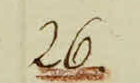26.
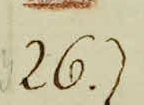26.
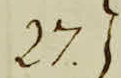27.
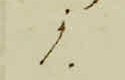1.
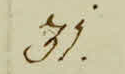31.
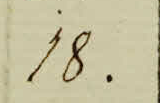18.
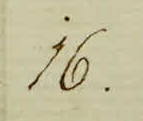16.
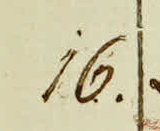16.
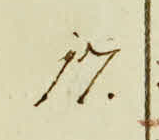17.
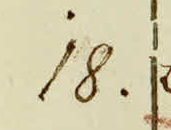18.
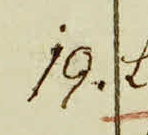19.
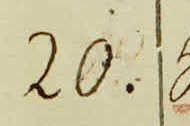20.
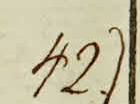42.
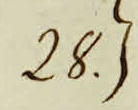28.
